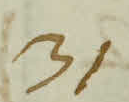31
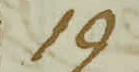19
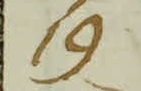19
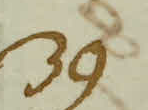39
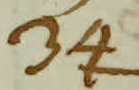34
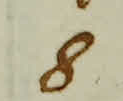8
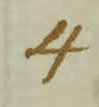4
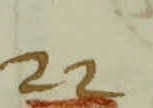22
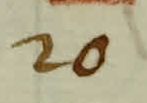20
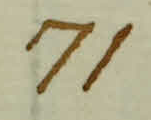71
